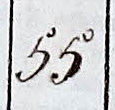55
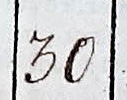30
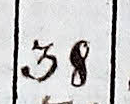38
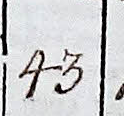43
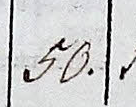50.
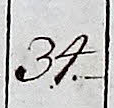34.
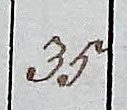35
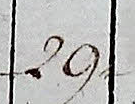29
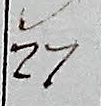27
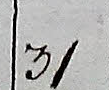31
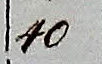40
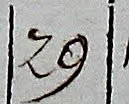29
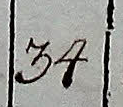34
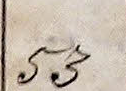53
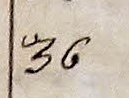36
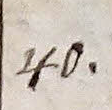40
